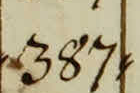387
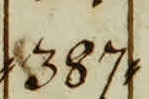387
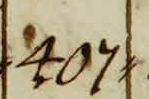407
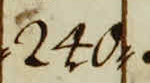240
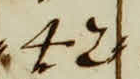42
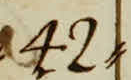42
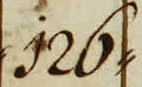126
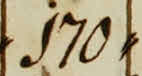170
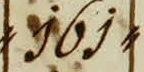161
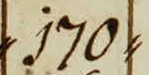170
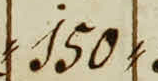150
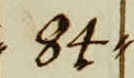84
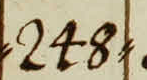248
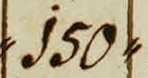150
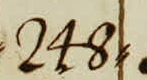248
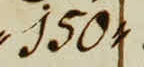150
